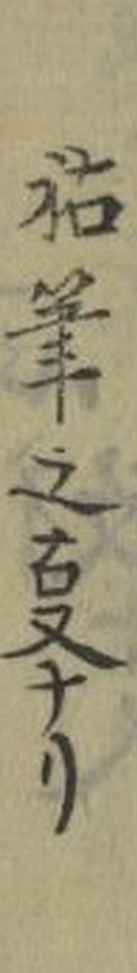祐筆之㕝ナリ
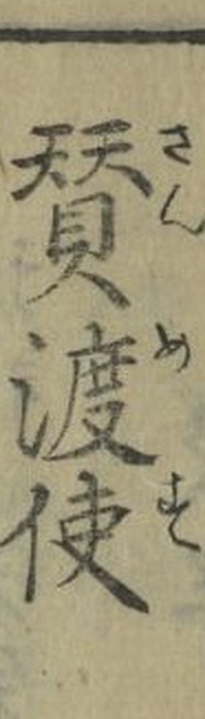賛渡使
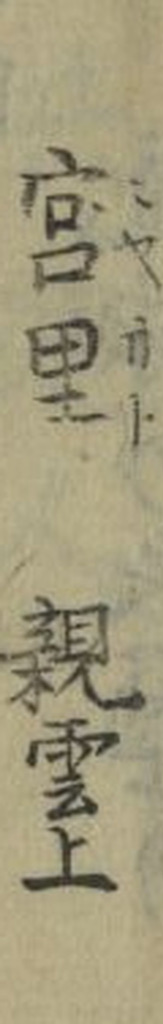宮里親雲上
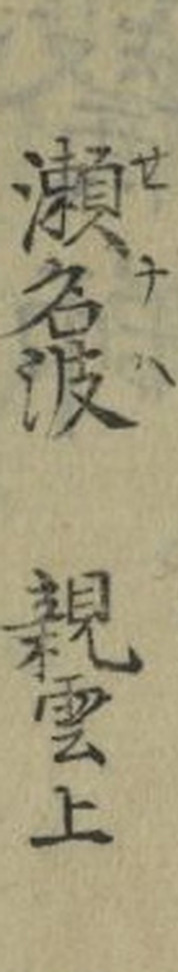瀬名波親雲上
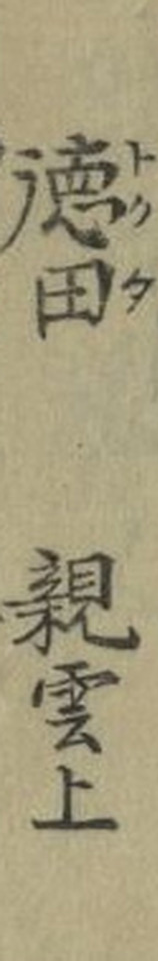徳田親雲上
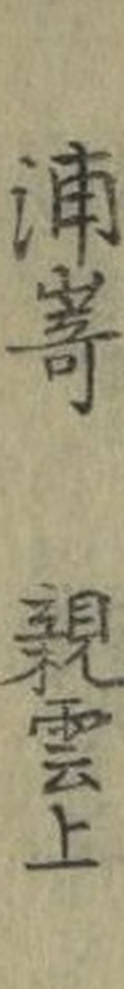浦嵜親雲上
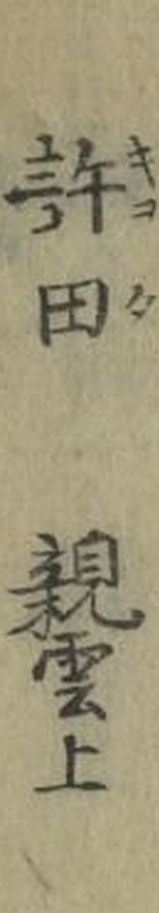許田親雲上

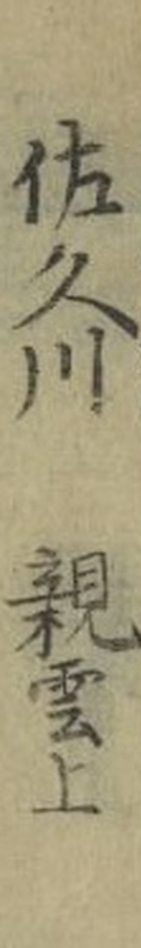佐久川親雲上
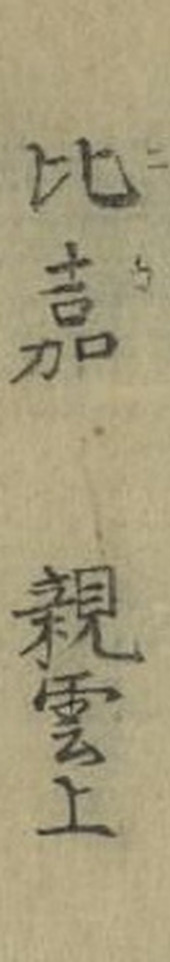比嘉親雲上
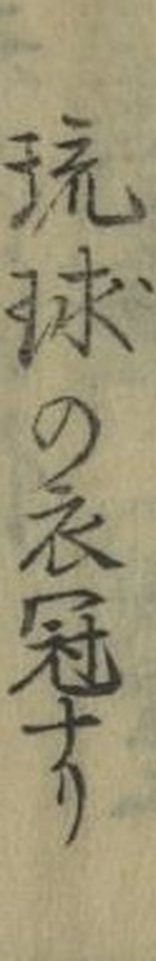琉球の衣冠ナリ
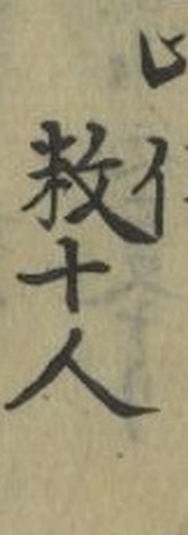数十人
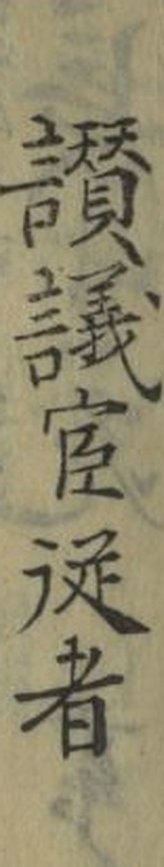讃議宦従者
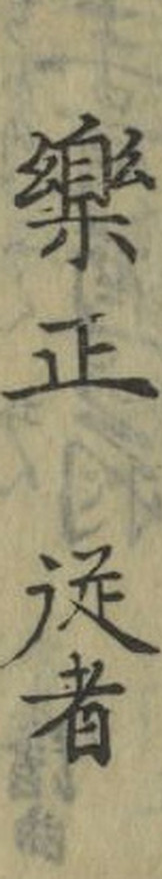樂正従者
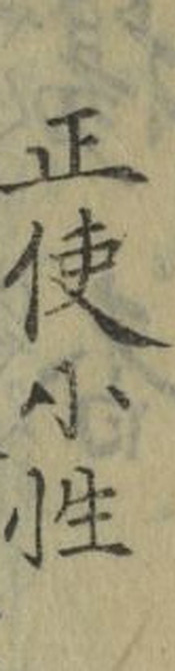正使小性
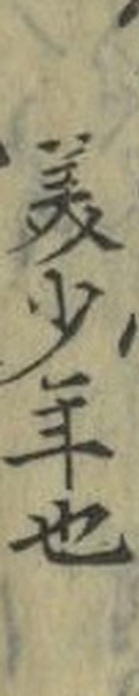美少年也
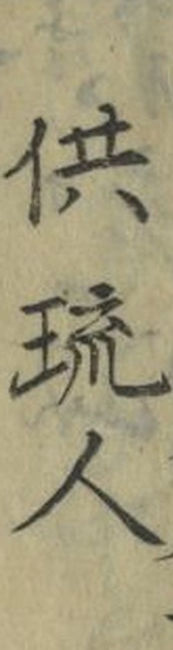供琉人
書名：[琉球人行列記]
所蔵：University of the Ryukyus Library
